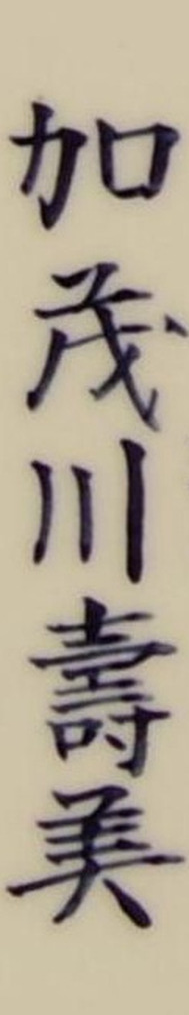加茂川壽美
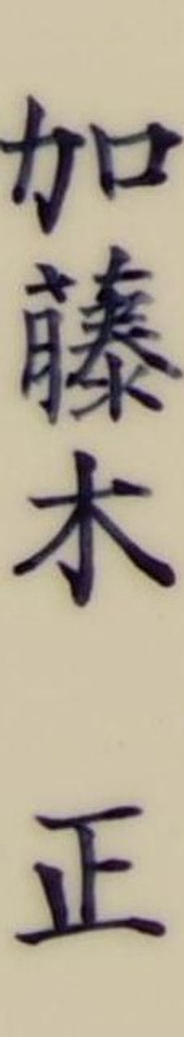加藤木正
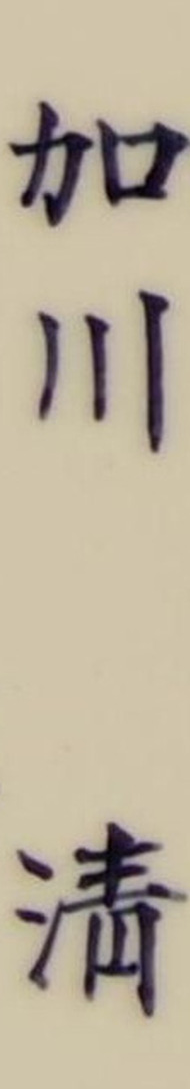加川清
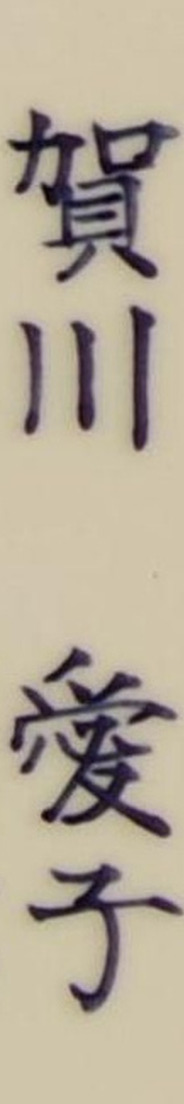賀川愛子
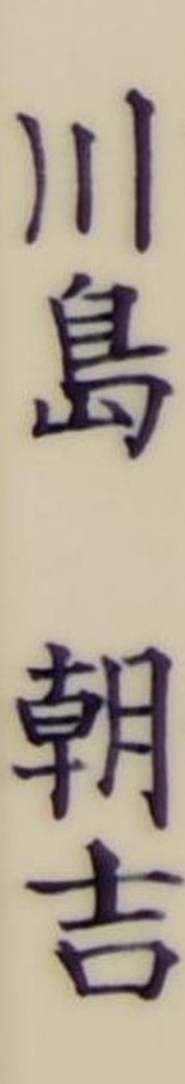川島朝吉

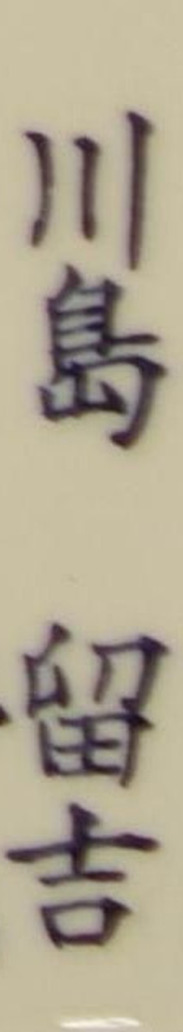川島留吉
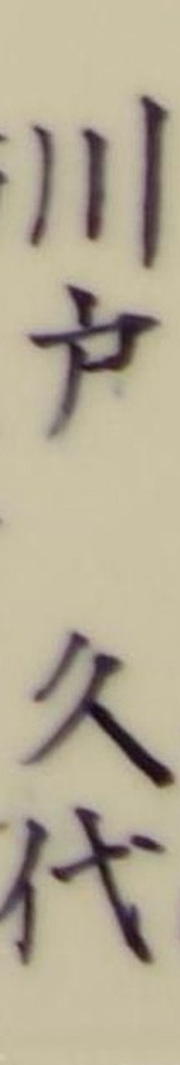川戸久代
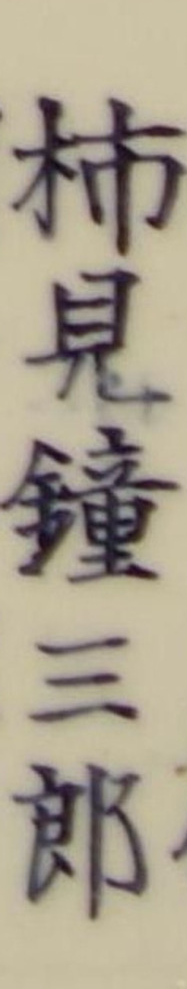柿見鐘三郎
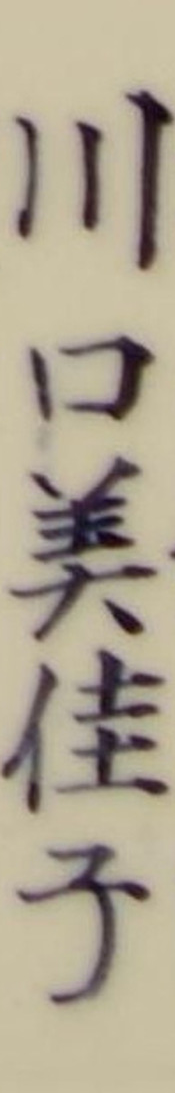川口美佳子
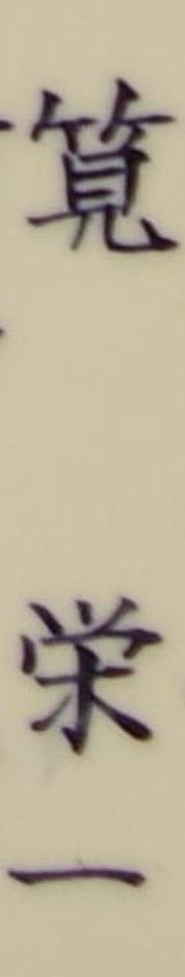筧栄一
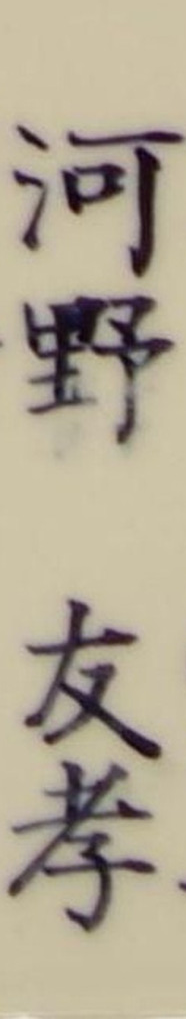河野友孝
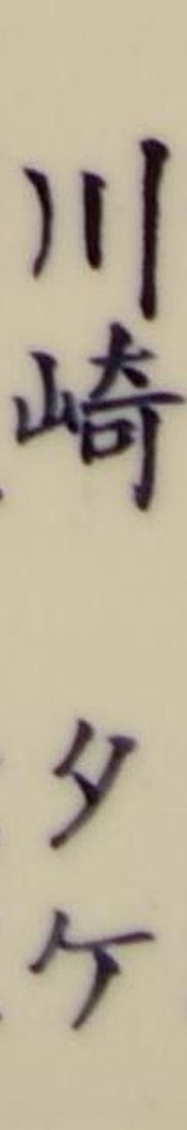川崎タケ
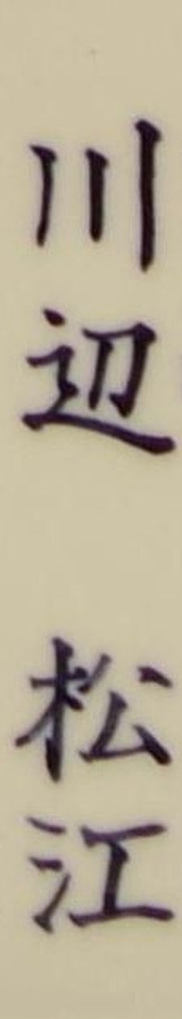川辺松江
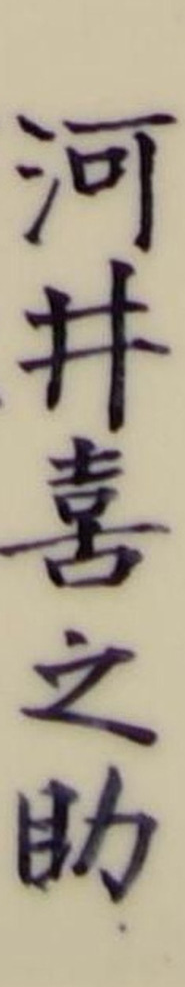河井喜之助
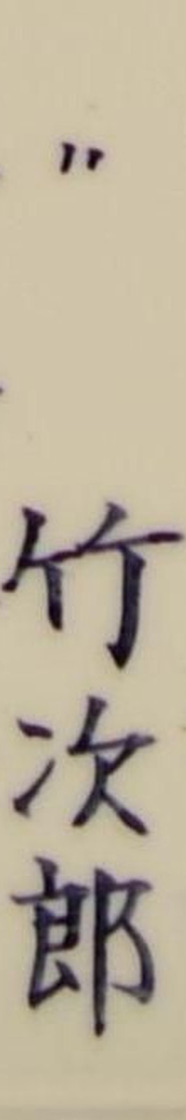竹次郎
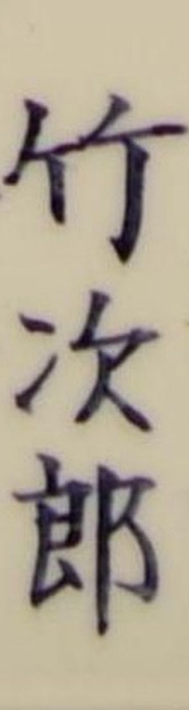竹次郎
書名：E~L
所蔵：高野山金剛峯寺
